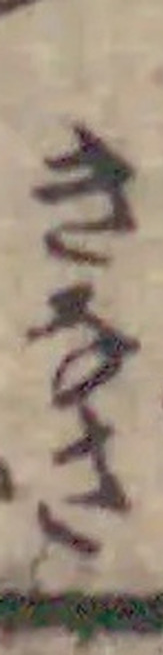きなさ
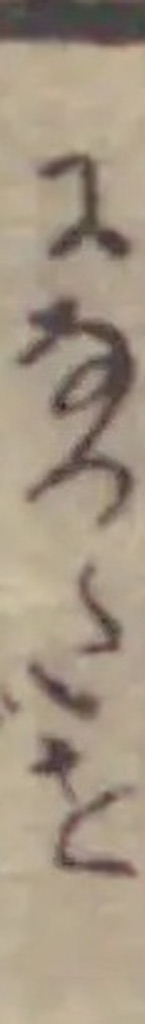になつたを
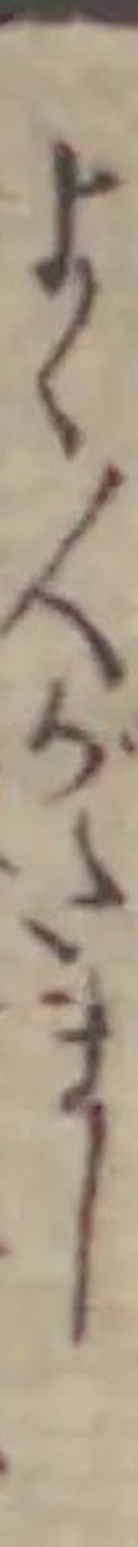よく人がたまし
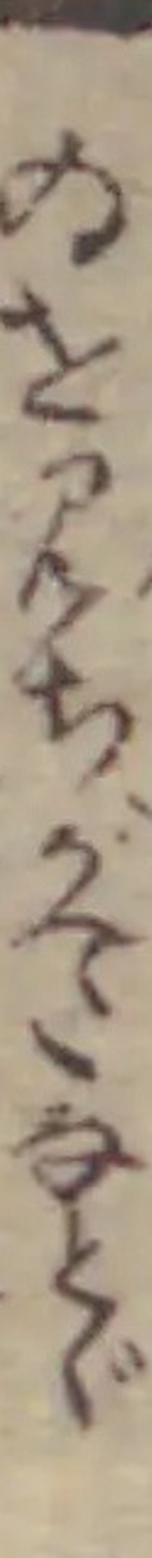ゐを見ちがへたなとゞ
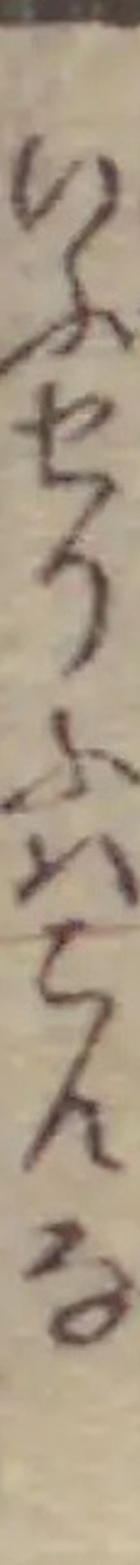いふせりふはこんな
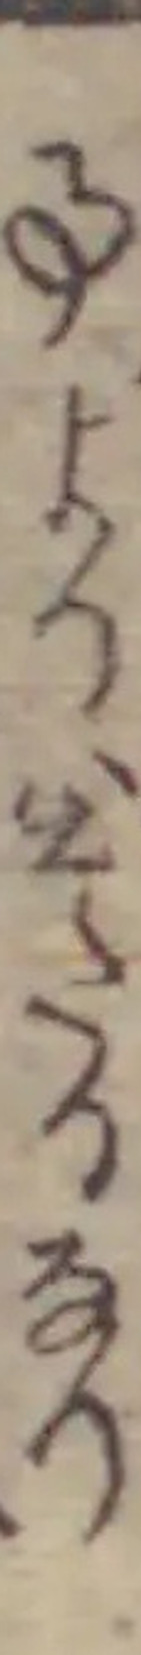事より出たるなり
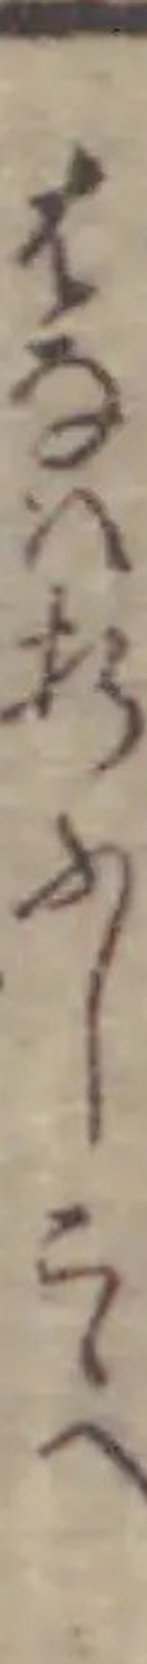はなは折ふしこゝへ
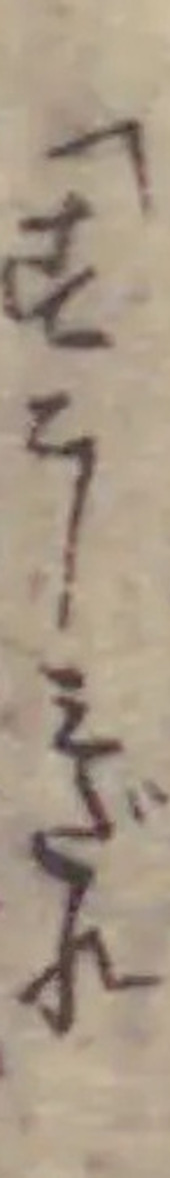〽すこしみだれ
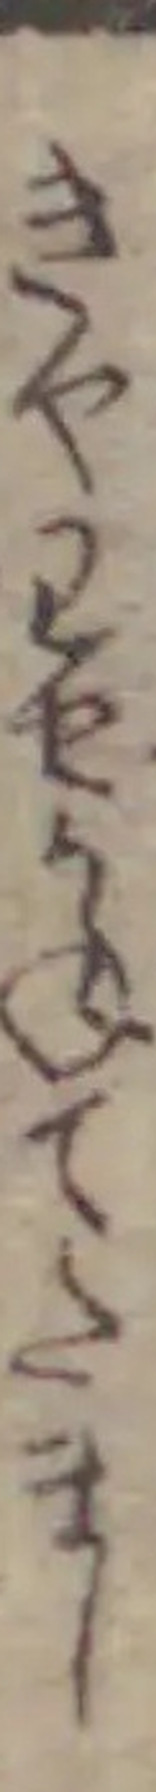きやわせかねてたまし
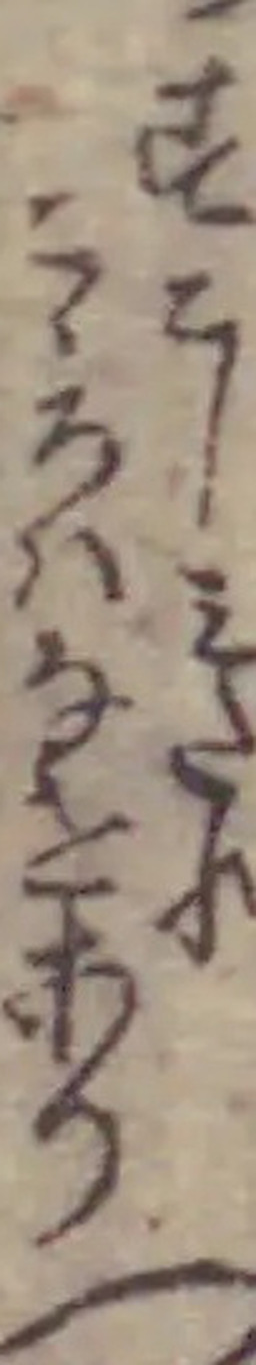こゝろはなをあり
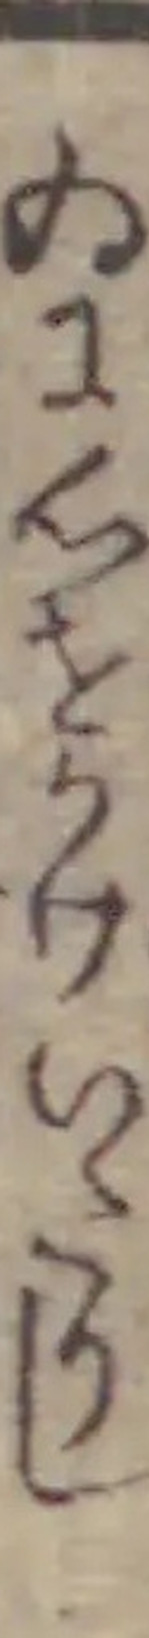ゐに心をかけいたりし
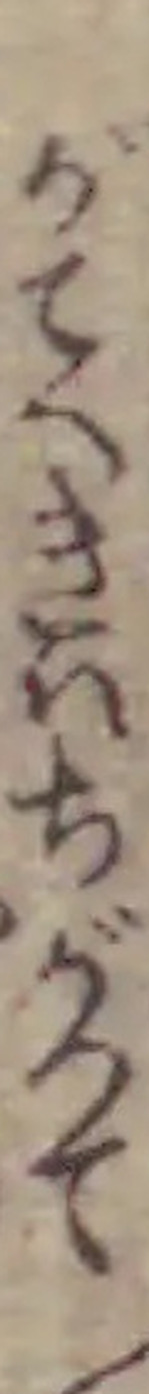がてへきはちがつて
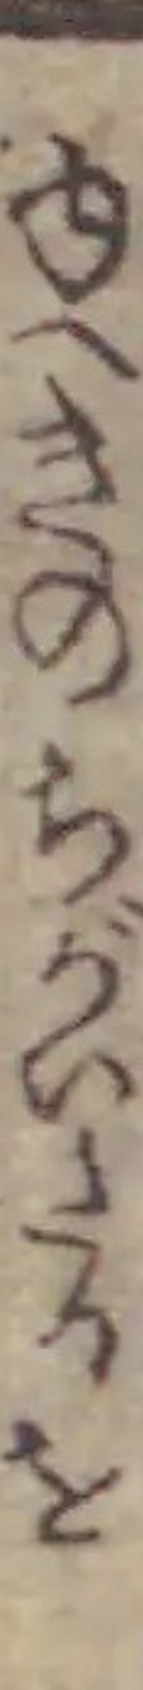ゆへきのちがいたるを
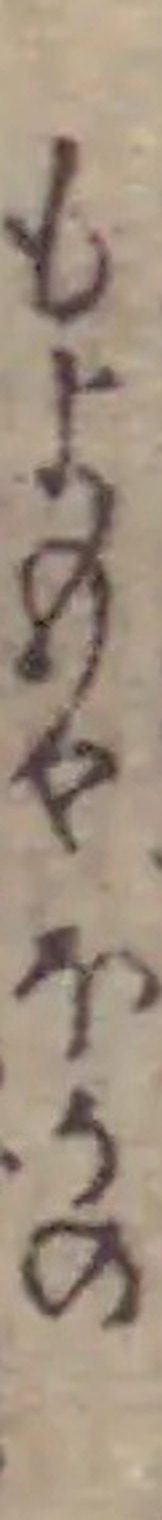もよもやほかの
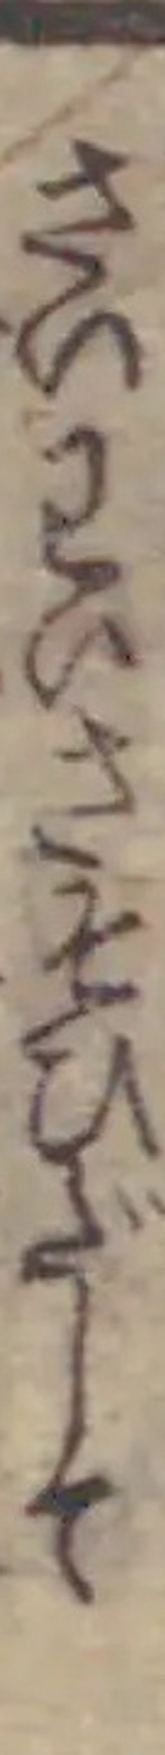さいわいさそひだして
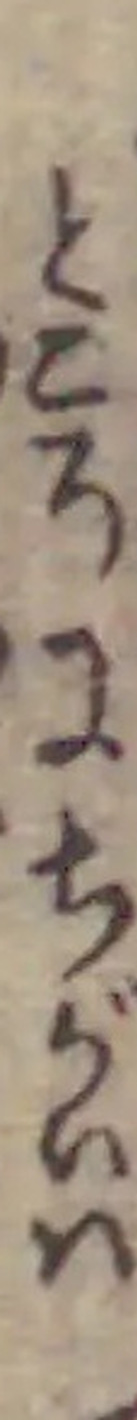ところにちがいは
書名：腹内養生主論 3巻
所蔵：国立国会図書館 National Diet Library, JAPAN
